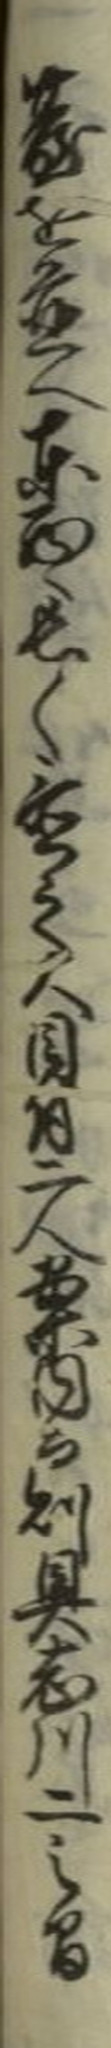を並へ東西へ長く置之大目付二人案内而則具志川二之間
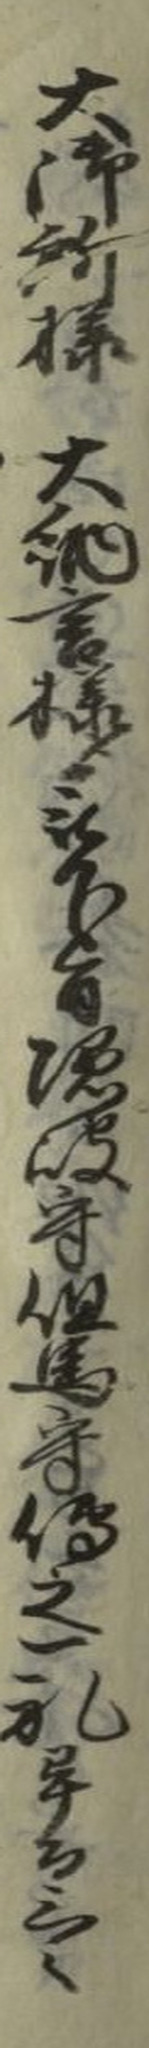大御所様大納言様ゟ被下旨隠岐守但馬守伝之一礼畢而三之
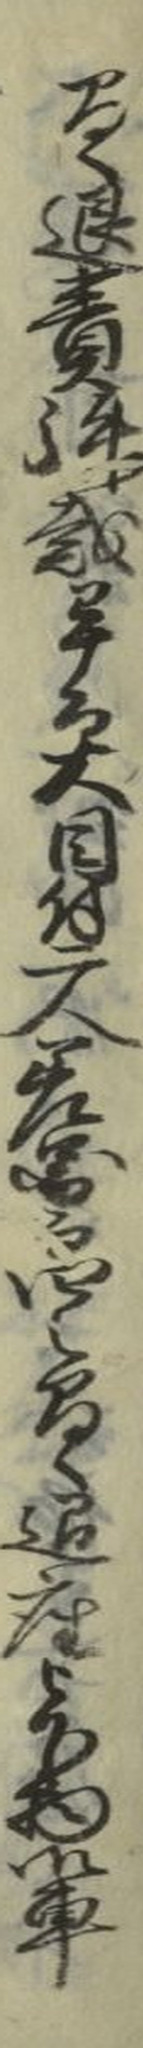間へ退責拝戴畢而大目付二人差図四之間へ退座被下物御車
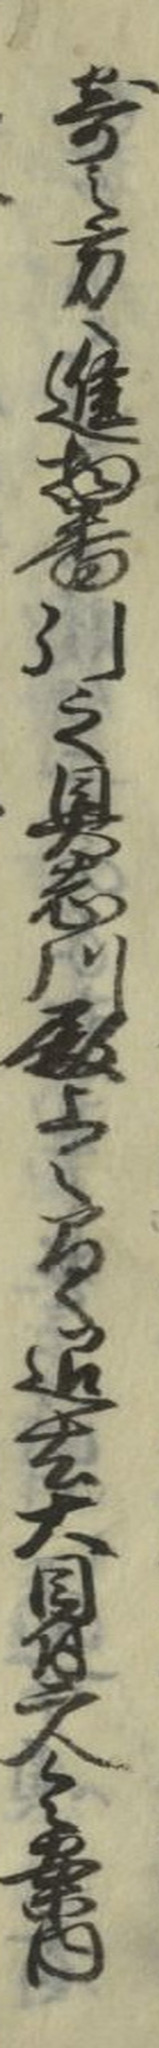寄之方へ進物番引之具志川殿上之間へ退去大目付二人令案内
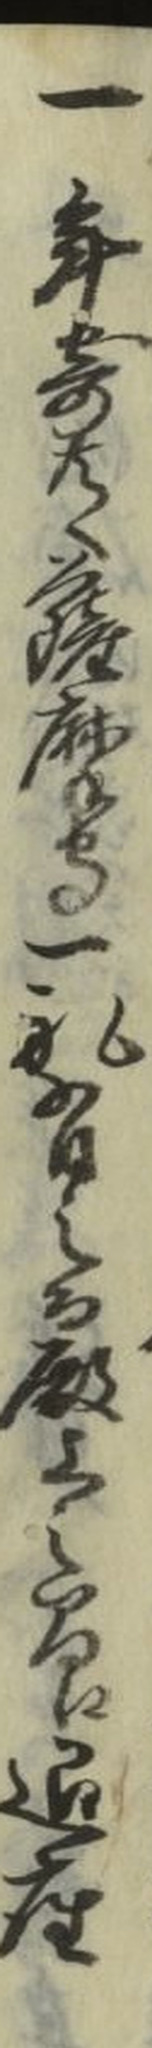一年寄共へ薩摩守一礼有之而殿上之間え退座
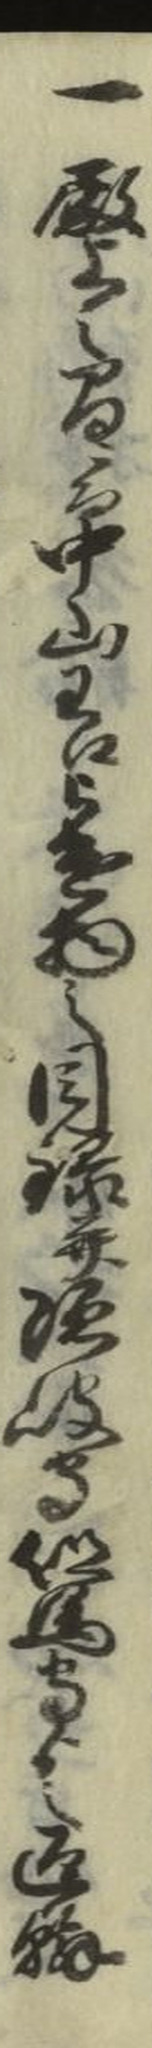一殿上之間に而中山王え披遣物之目録并隠岐守但馬守ゟ之返翰
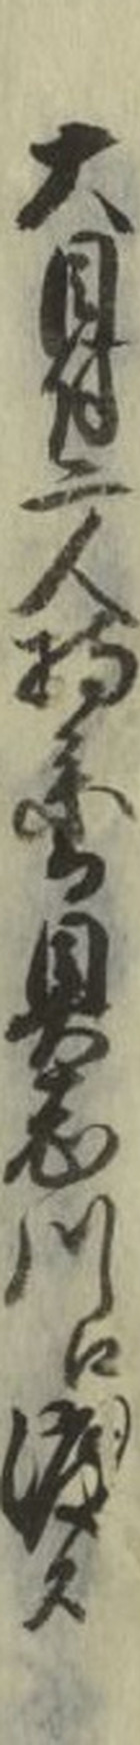大目付二人持参而具志川え渡ス
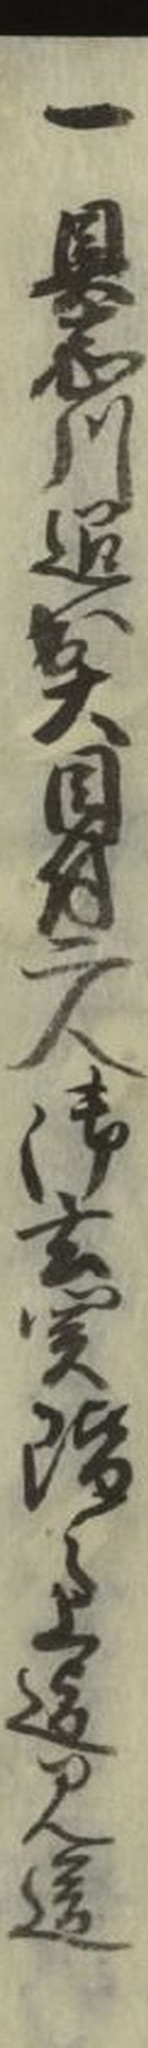一具志川退出大目付二人御玄関階之上迄見送
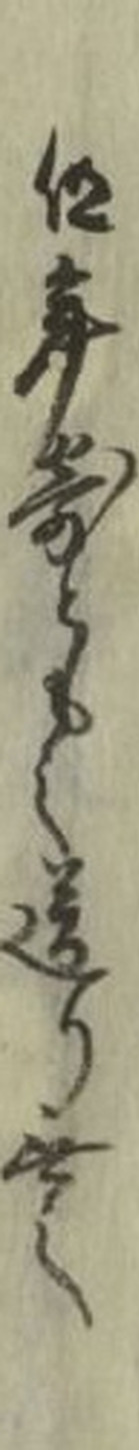但年寄とも之送り無之
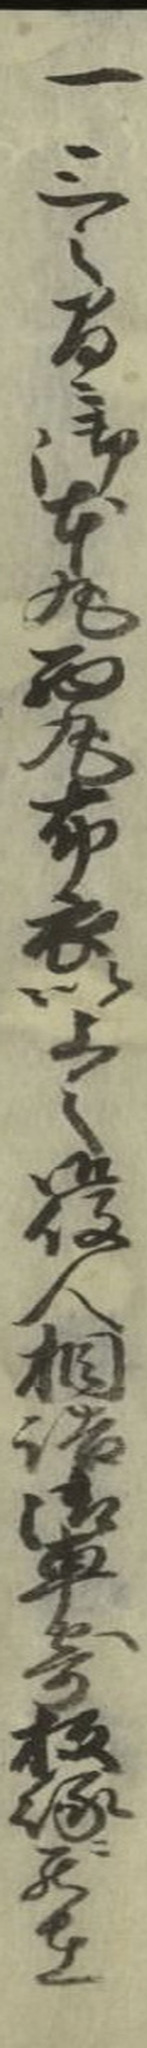一三之間に御本丸西丸布衣以上之御役人相詰御車寄板縁に罷在
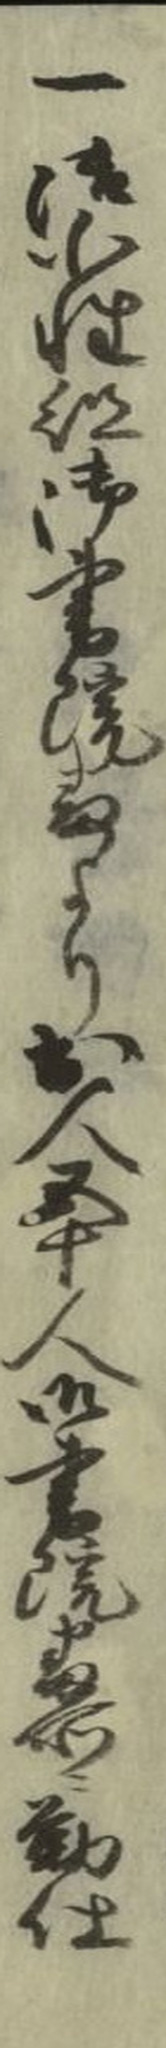一御小姓組御書院番より出人五十人御書院番に勤任
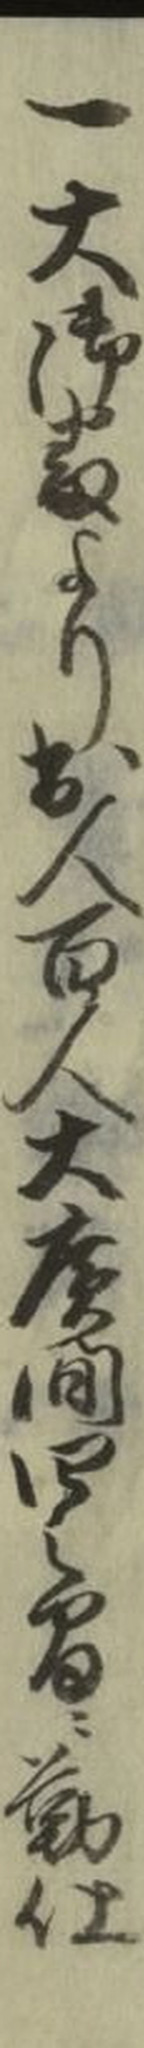一大御番より出人百人大広間四之間に勤任

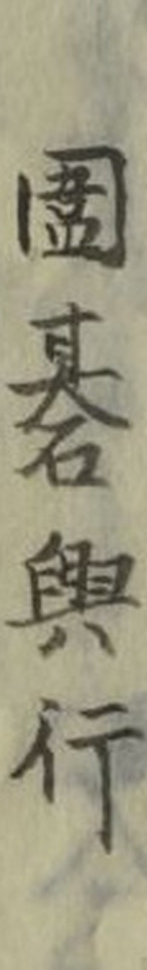囲碁興行
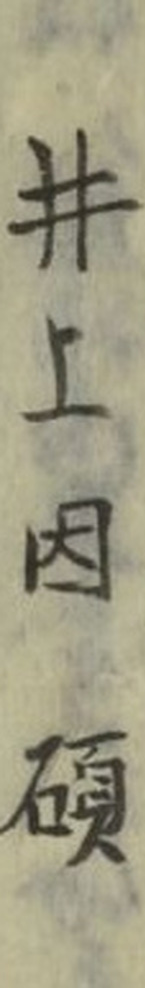井上因碩
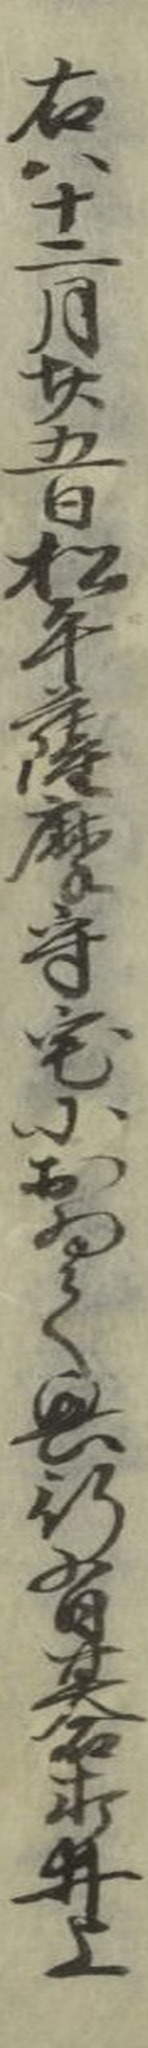右は十二月廿五日松平薩摩守宅において興業有碁打井上
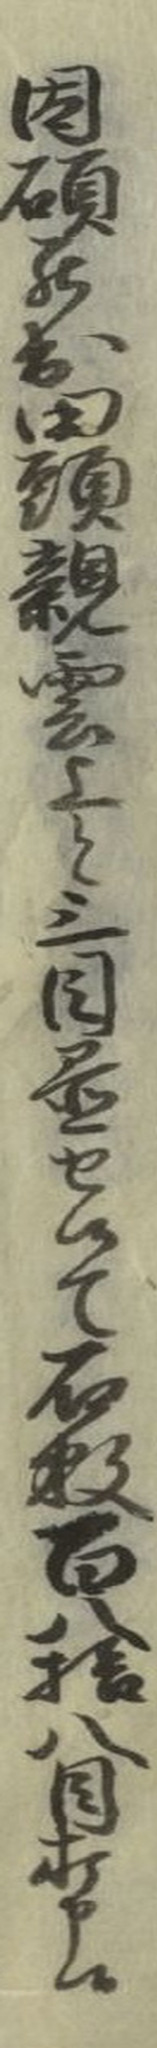因碩罷出田頭親雲上と三目置せ候て石数百八拾八目打申候
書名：琉球人来朝之記
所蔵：University of the Ryukyus Library
